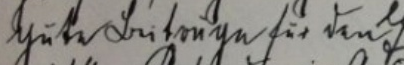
gute Beiträge für den
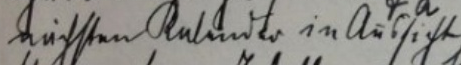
nächsten Kalender in Aussicht
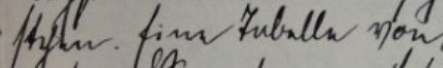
stehen. Eine Tabelle von
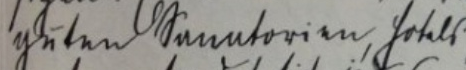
guten Sanatorien, Hotels
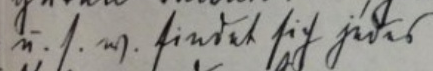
u.f.m. findet sich jeder
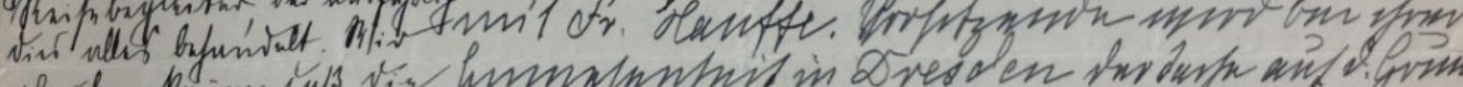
dies alles behandelt. Wir
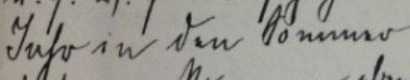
Info in den Sommer
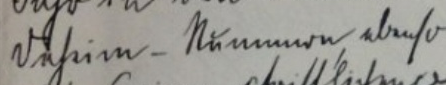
ferien. Nummern
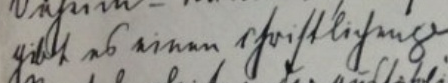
gibt es einem christlichen
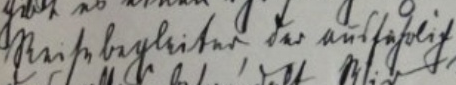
Reisebegleiter der ausführlich
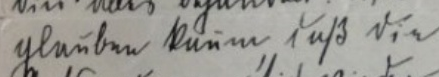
glauben kaum, daß die
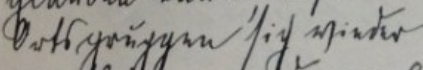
Ortsgruppen sich wieder
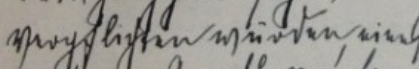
verpflichten würden eine
